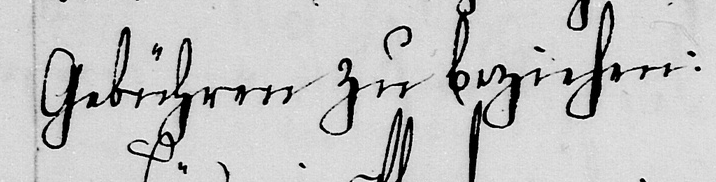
Gebühren zu beziehen:
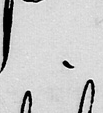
2.
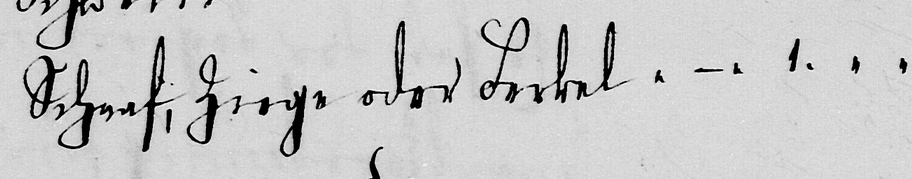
Schaaf, Ziege oder Ferkel – “ 1. “
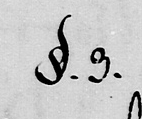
§. 3.
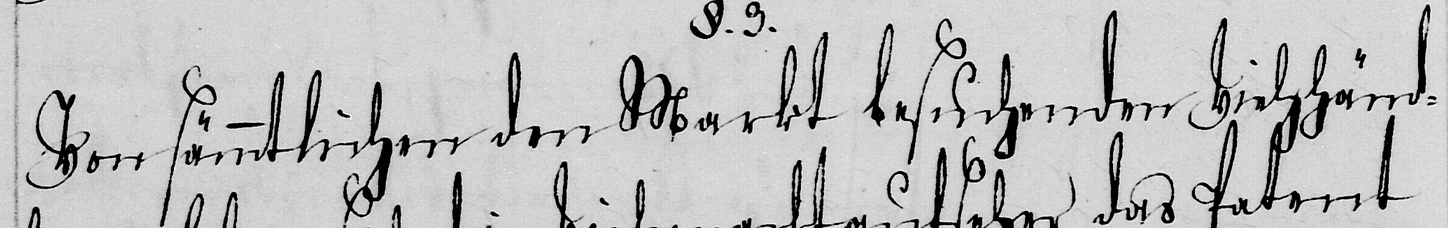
Von sämmtlichen den Markt besuchenden Viehhänd¬
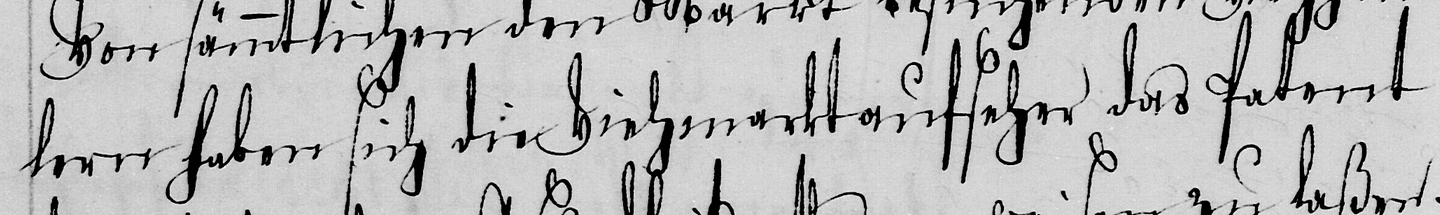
lern haben sich die Viehmarktaufseher das Patent
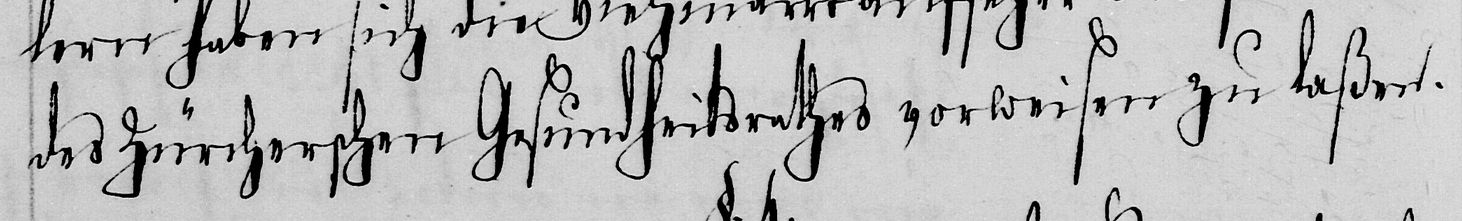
des Zürcherschen Gesundheitsrathes vorweisen zu laßen.
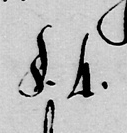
4.
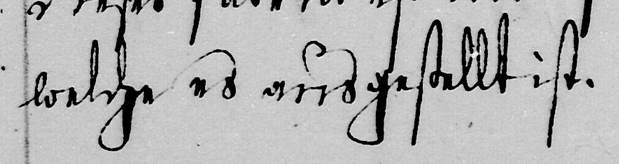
welche es ausgestellt ist.
